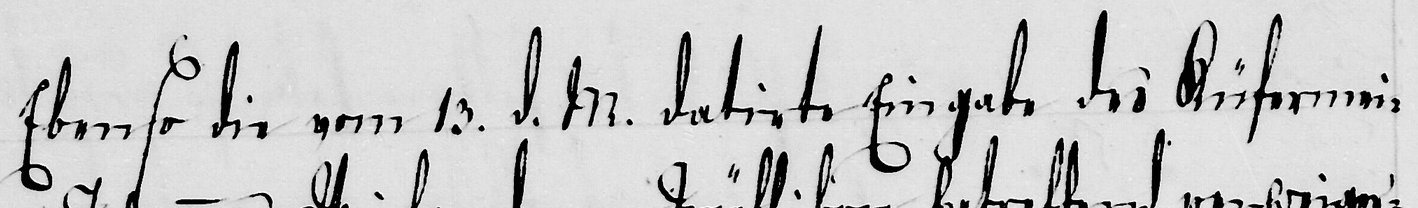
Ebenso die vom 13. d. M. datirte Eingabe des Küfermei¬
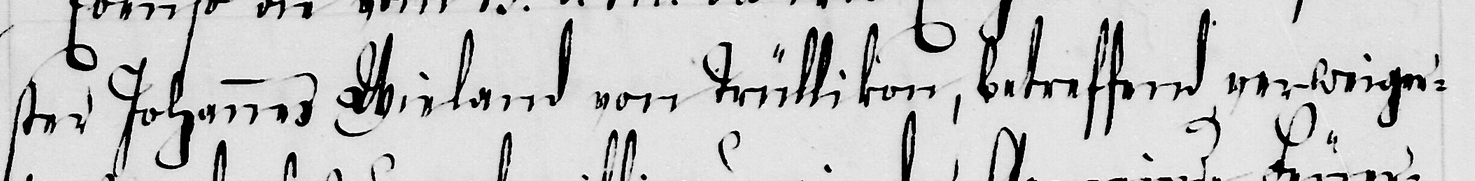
ster Johannes Wieland von Trüllikon, betreffend verweiger¬
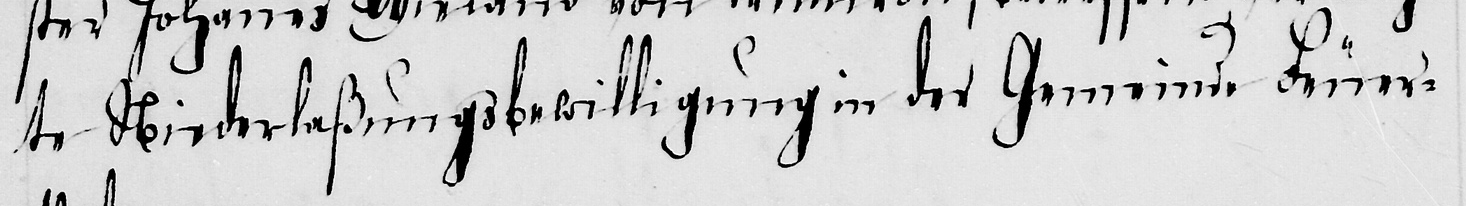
te Niederlaßungsbewilligung in der Gemeinde Feuer¬
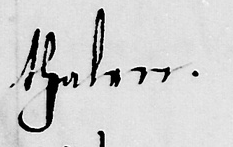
thalen.
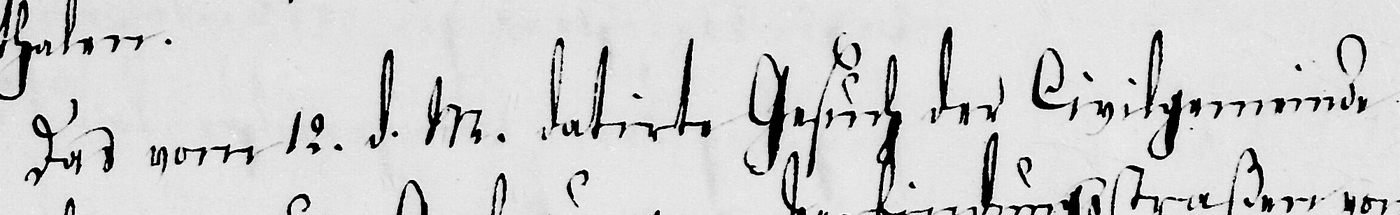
Das vom 12. d. M. datirte Gesuch der Civilgemeinde
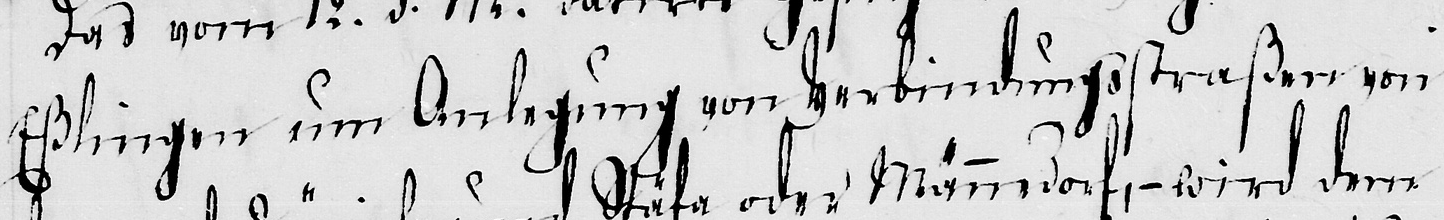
Eßlingen um Anlegung von Verbindungsstraßen von
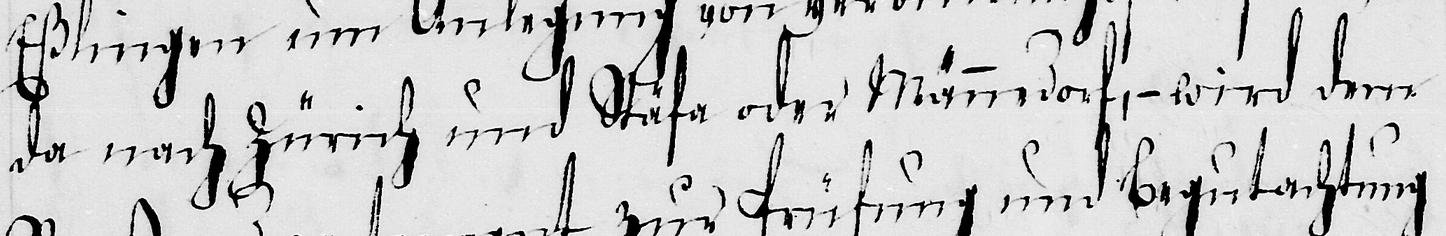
da nach Zürich und Stäfa oder Männedorf, – wird dem
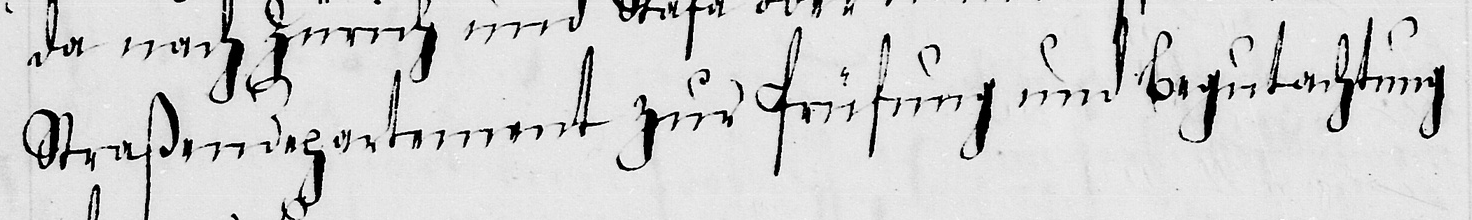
Straßendepartement zur Prüfung und Begutachtung
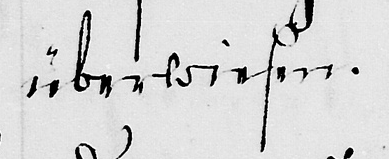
überwiesen.
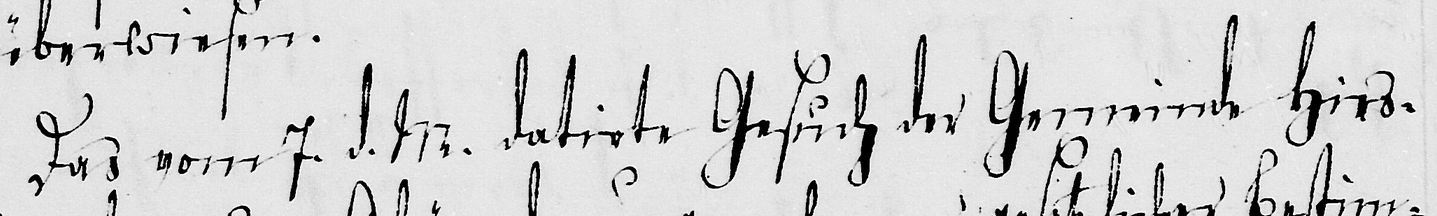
Das vom 7. d . M. datirte Gesuch der Gemeinde Hirs¬
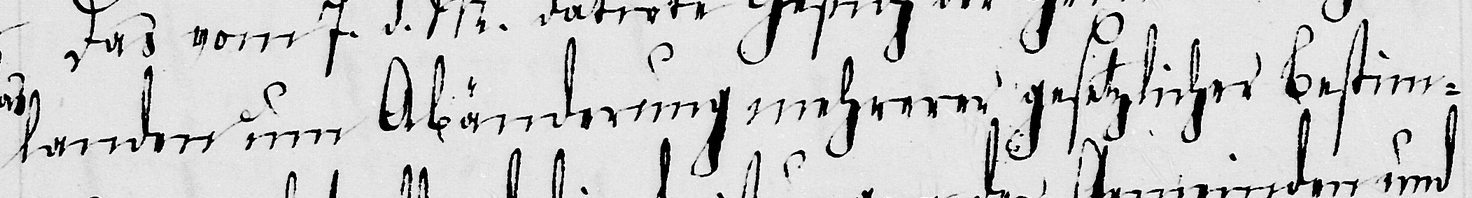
landen um Abänderung mehrerer gesetzlicher Bestim¬
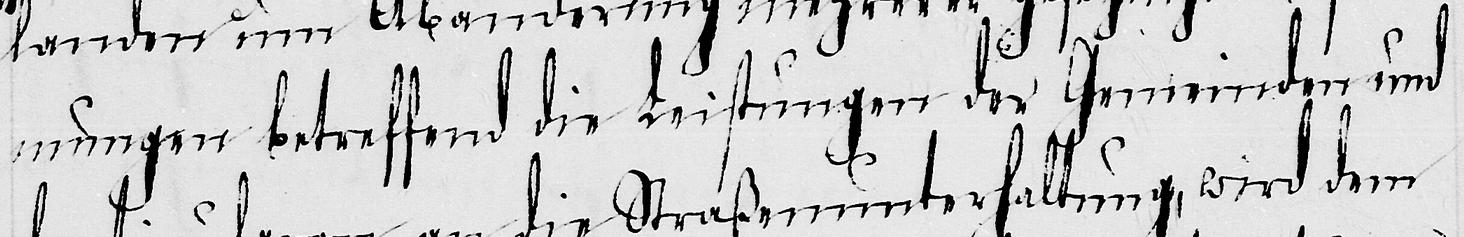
mungen betreffend die Leistungen der Gemeinden und
